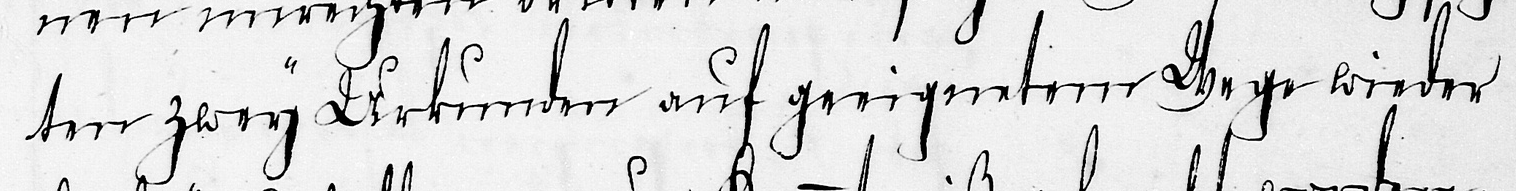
ten zwey Urkunden auf geeignetem Wege wieder
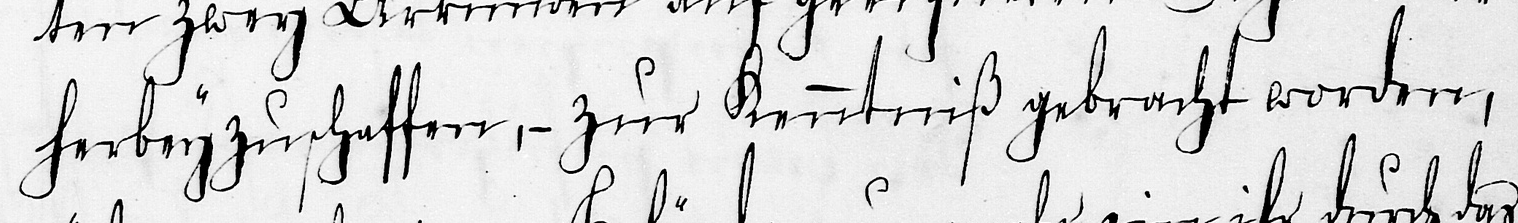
herbeyzuschaffen, – zur Kenntniß gebracht worden,
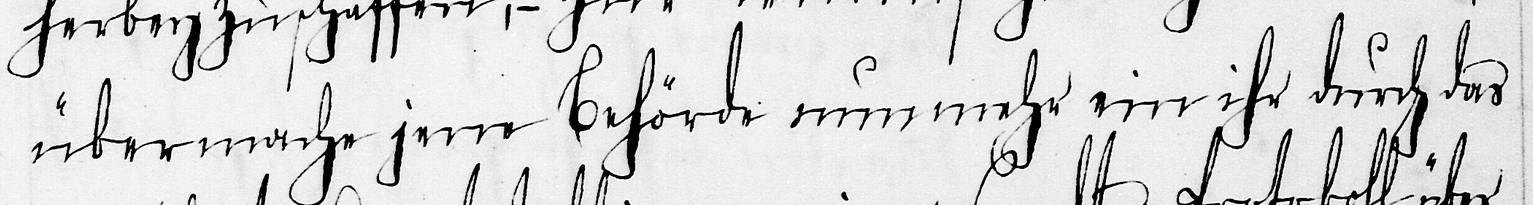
übermache jene Behörde nunmehr ein ihr durch das
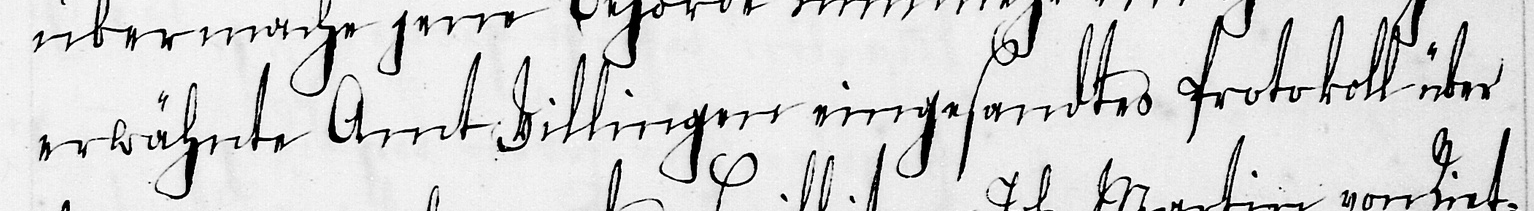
erwähnte Amt Villingen eingesandtes Protokoll über
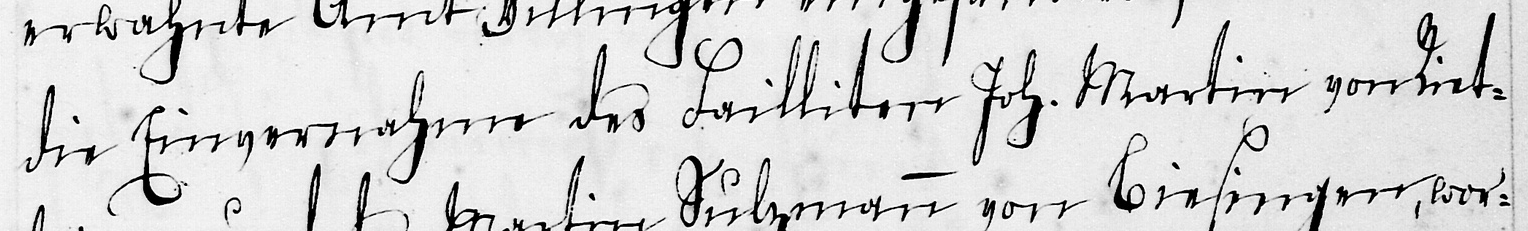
die Einvernahme des Failliten Joh. Martin von Riet¬
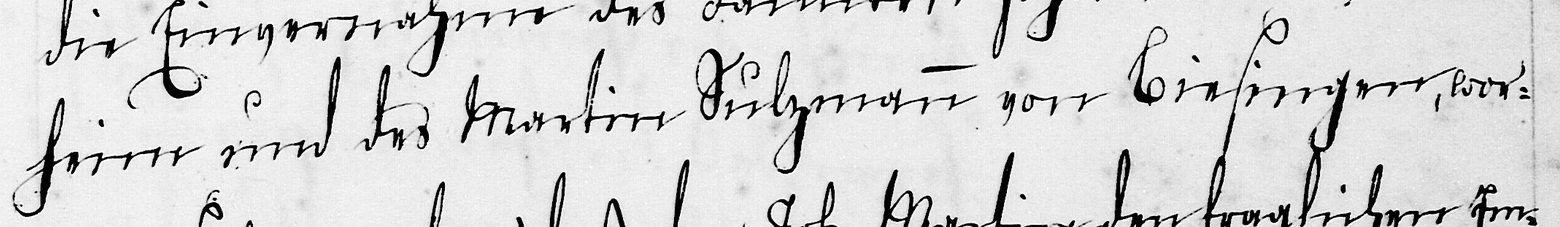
heim und des Martin Sulzmann von Biesingen, wor¬
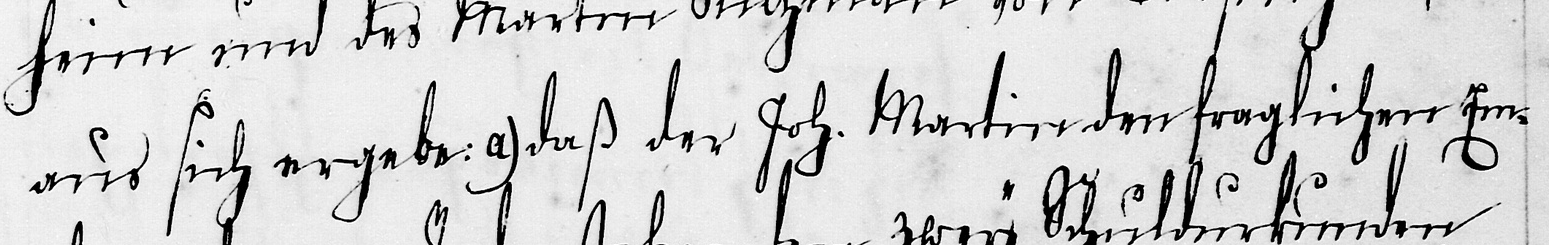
aus sich ergebe: a) daß der Joh. Martin den fraglichen Em¬
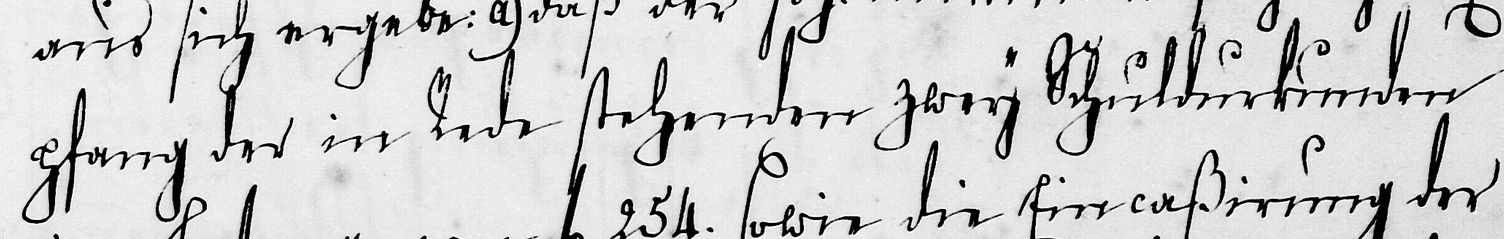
pfang der in Rede stehenden zwey Schuldurkunden
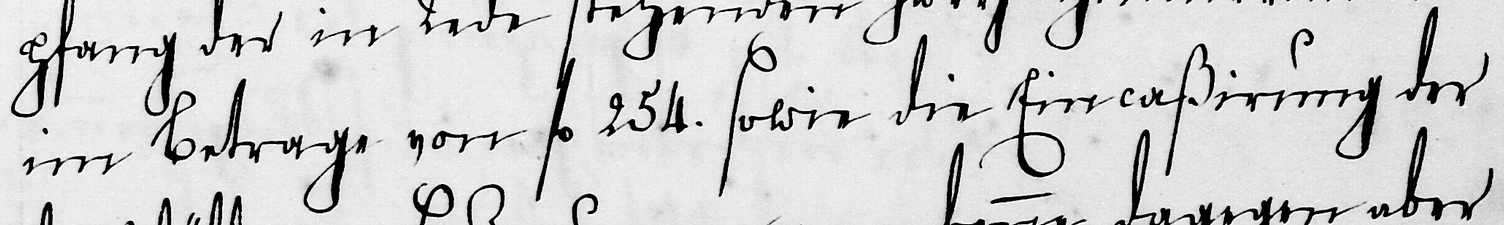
im Betrage von fl. 254. sowie die Eincaßirung der
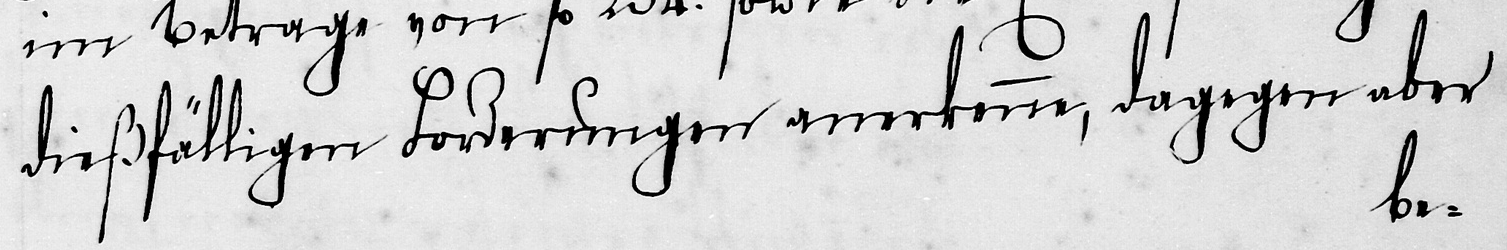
dießfälligen Forderungen anerkenne, dagegen aber
